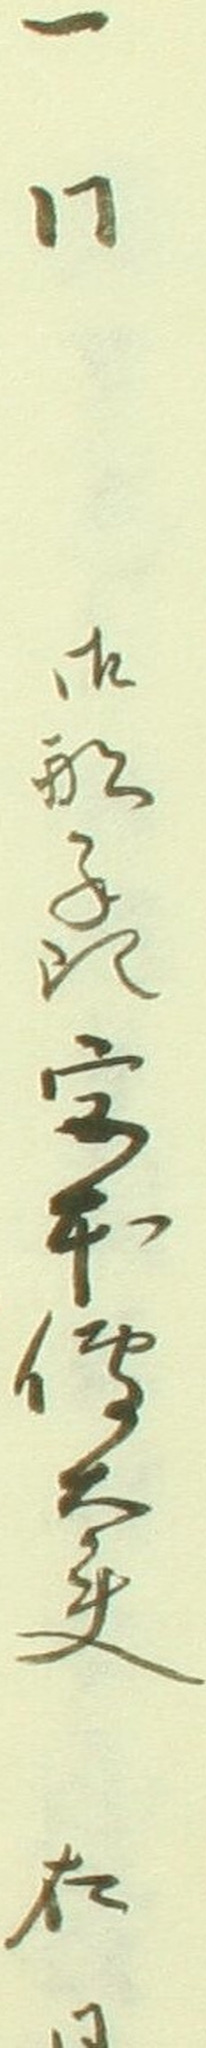一同御船手頭宮本伝太夫右同断
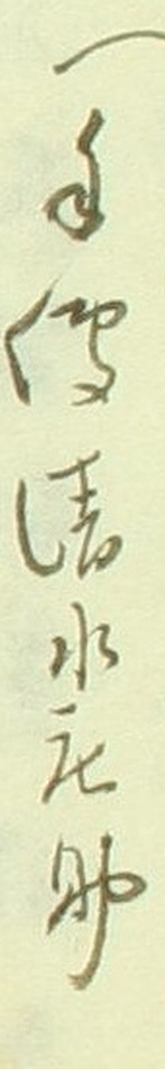手伝清水庄助
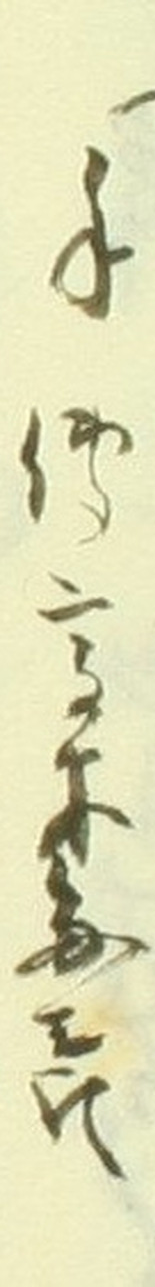手伝高木多三郎
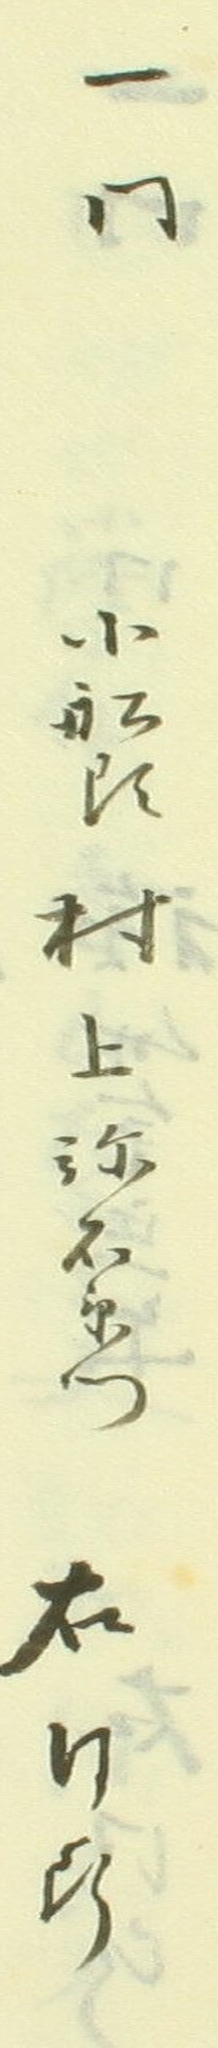一同小船頭村上弥右衛門右同断
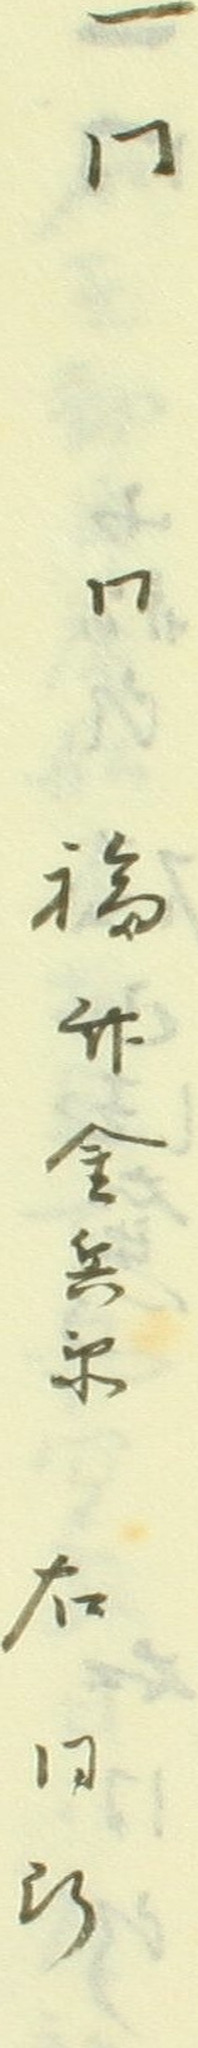一同同福竹金兵衛右同断
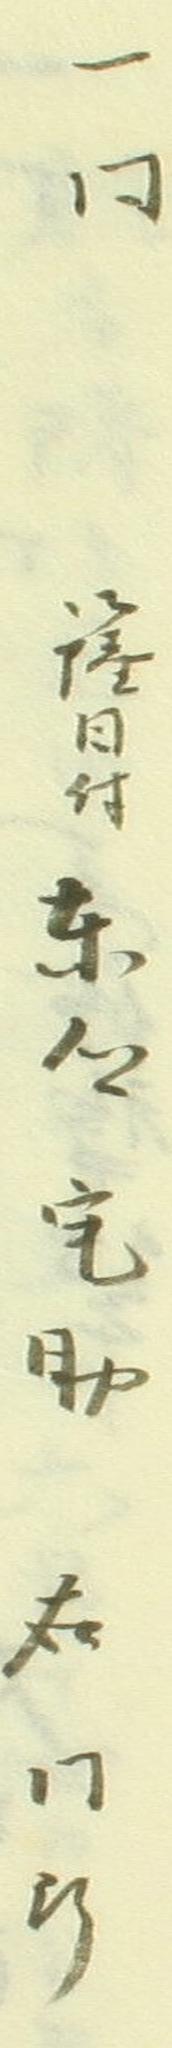一同御陸目付東郷宅助右同断
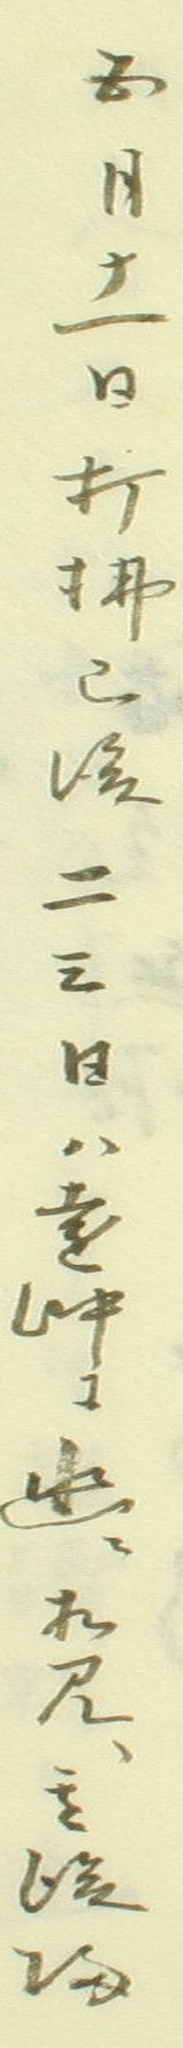五月十一日打払己後二三日は遠沖に逃に相見へ其後帰
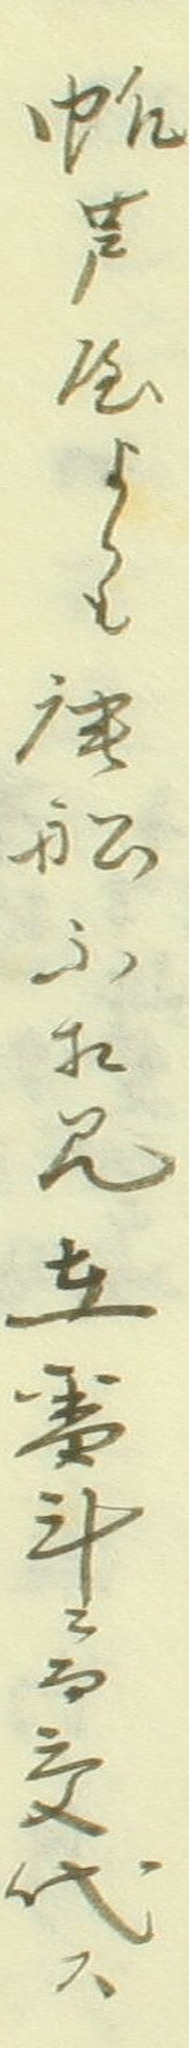帆芦屋よりも唐船不相見在番斗に而交代す
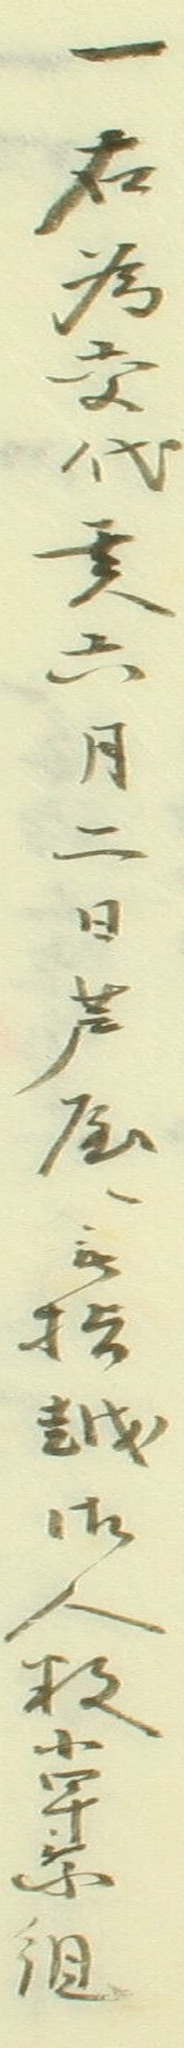一右為交代亥六月二日芦屋へ被指越御人数小早乗組
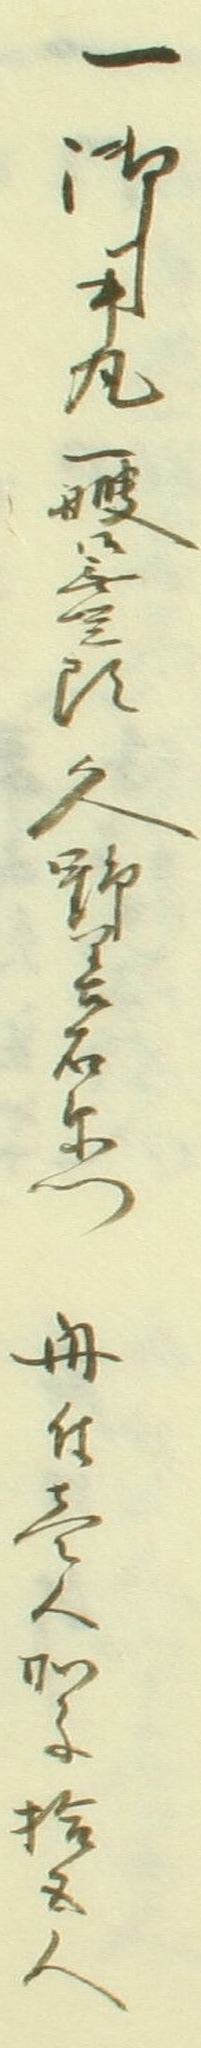一御用丸一艘御無足頭久野望右衛門舟付壱人加子拾五人
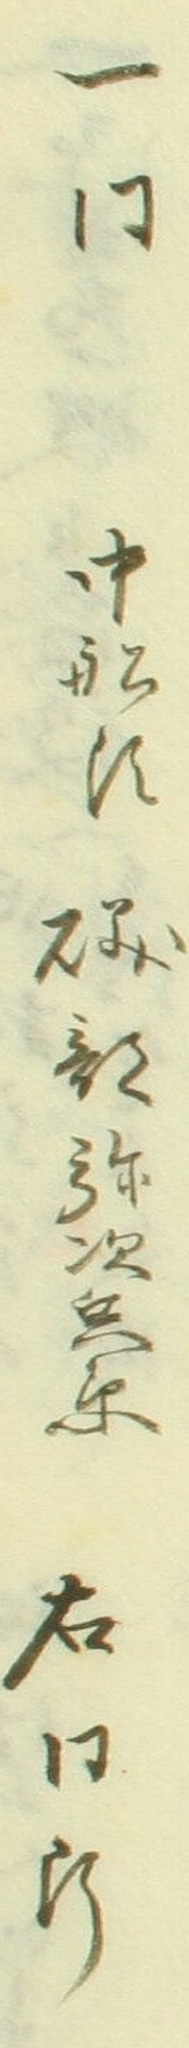一同中船頭磯部弥次兵衛右同断

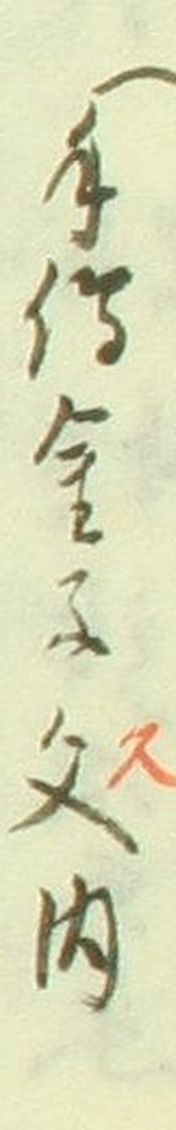手伝金子文内
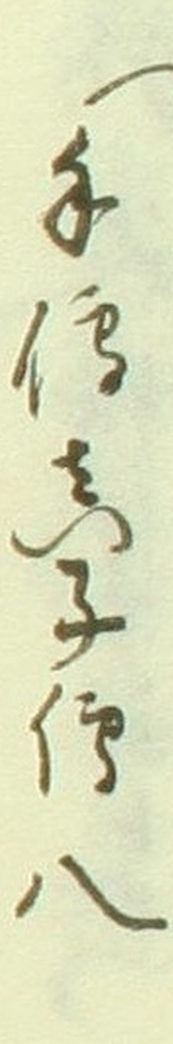手伝真子伝八
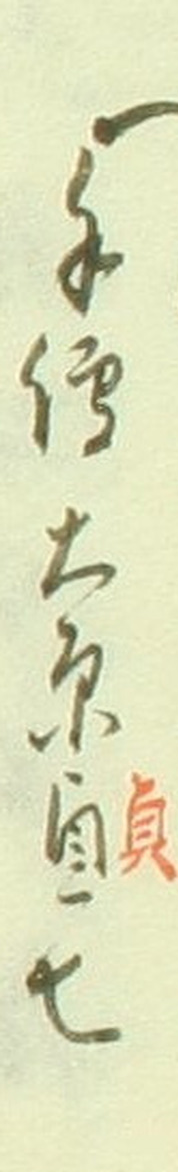手伝大原貞七
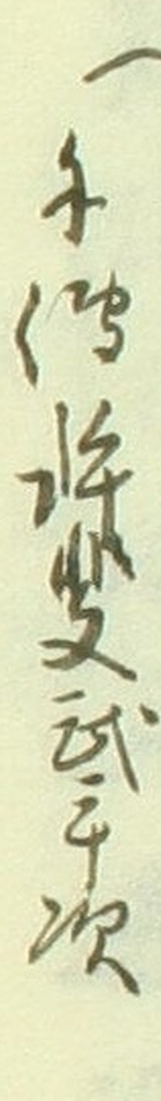手伝許斐武平次
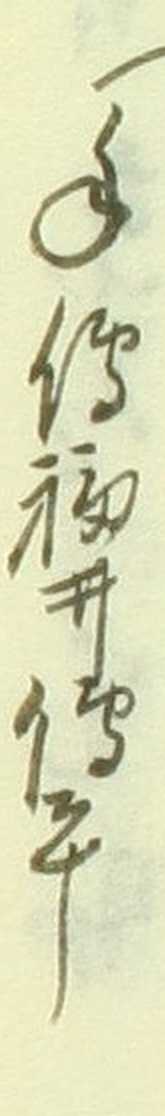手伝福井伝平
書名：唐船漂流記 三
